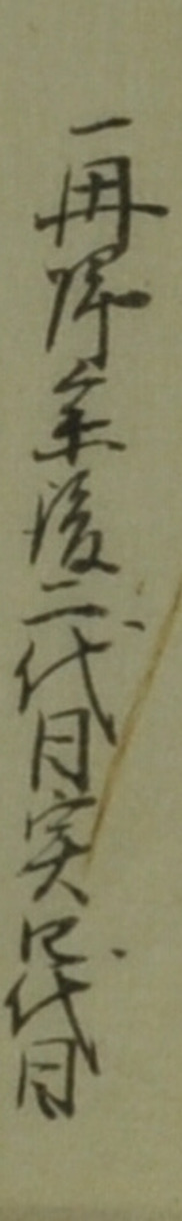再帰参後二代目実四代目
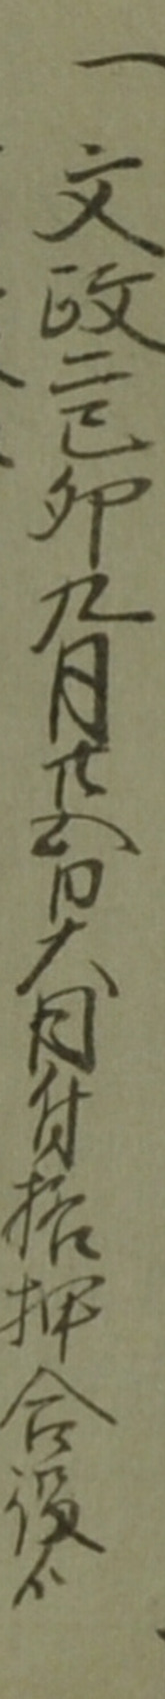一文政二己卯九月廿五日大目付格押合役ゟ
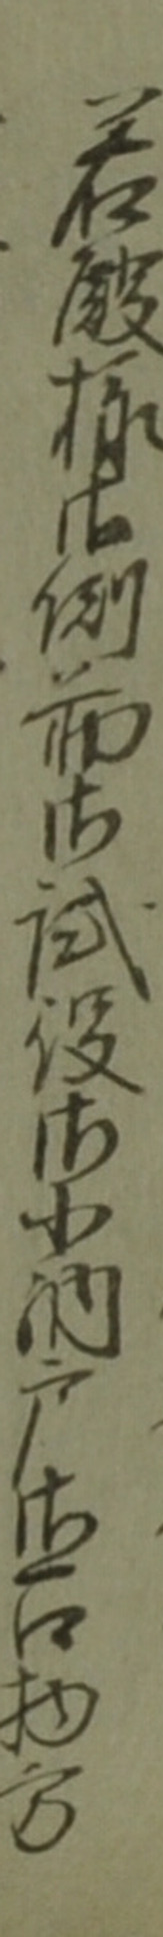若殿様御側勤御試役御小納戸御召物方
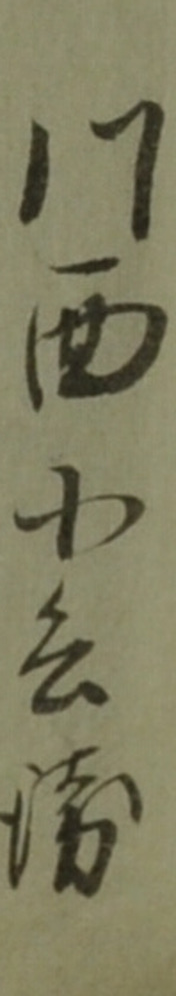川西小兵衛
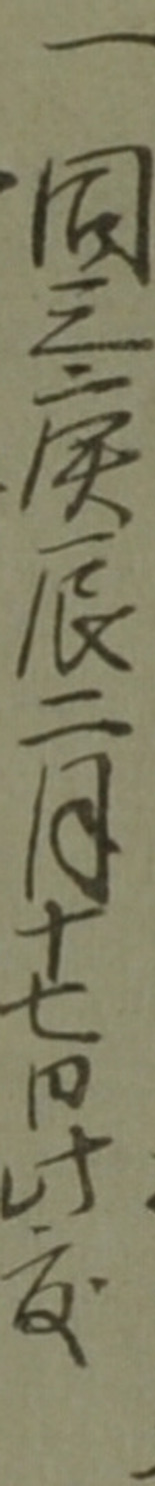一同三庚辰二月十七日此度
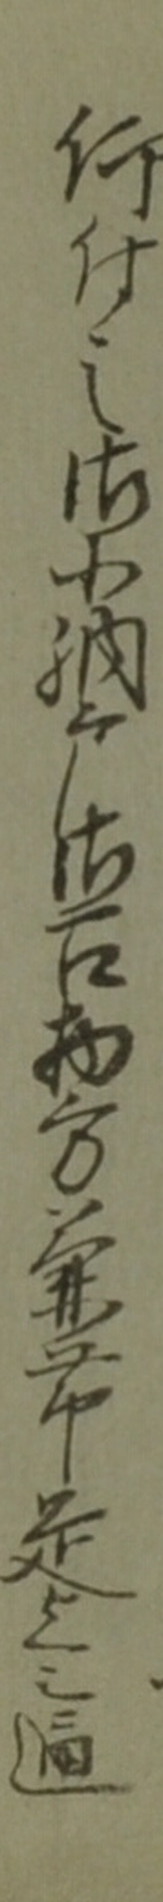仰付之御小納戸御召物方兼帯是迄之通
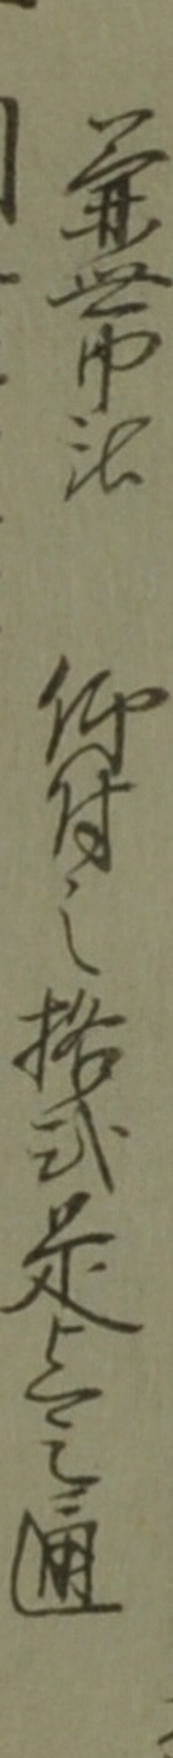兼帯被仰付之格式是迄之通
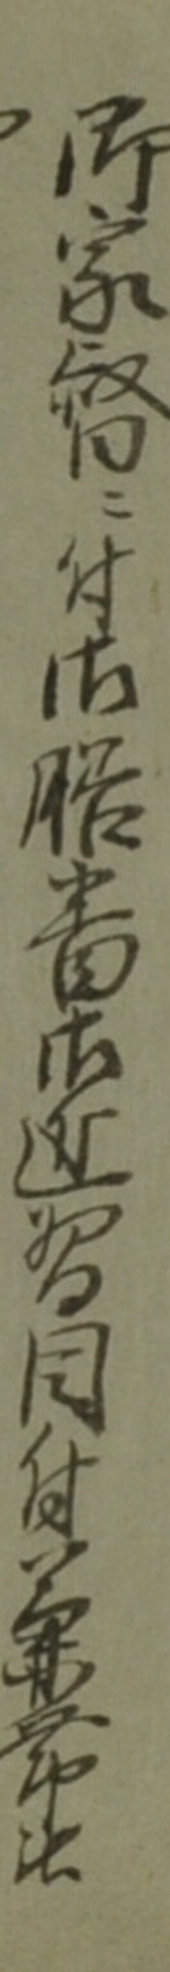御家督ニ付御膳番御近習目付兼帯被
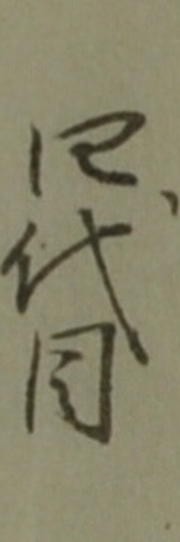四代目
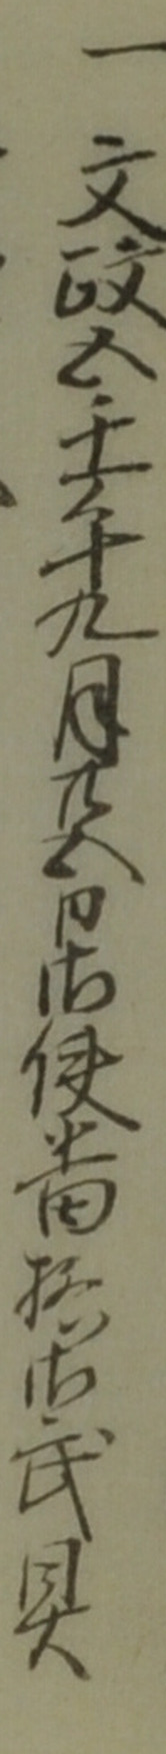一文政五壬午九月廿五日御使番格御武具
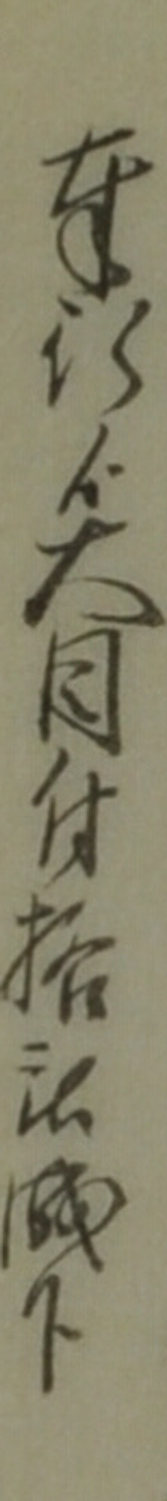奉行ゟ大目付格被成下
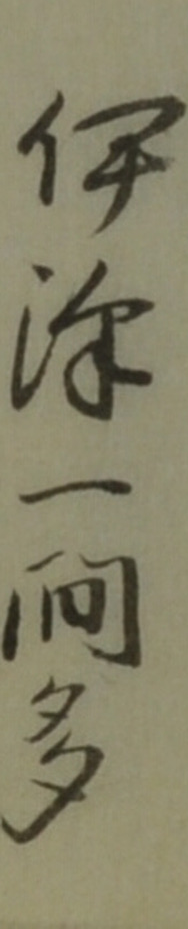伊沢一間多
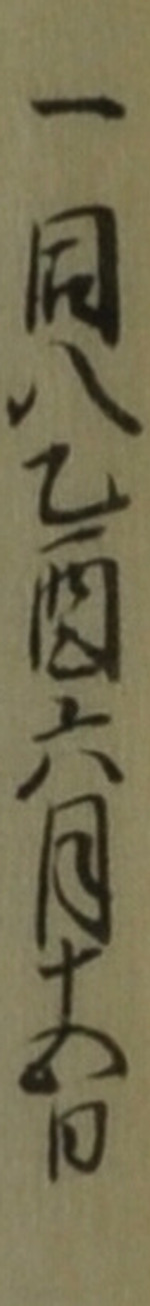一同八乙酉六月十五日
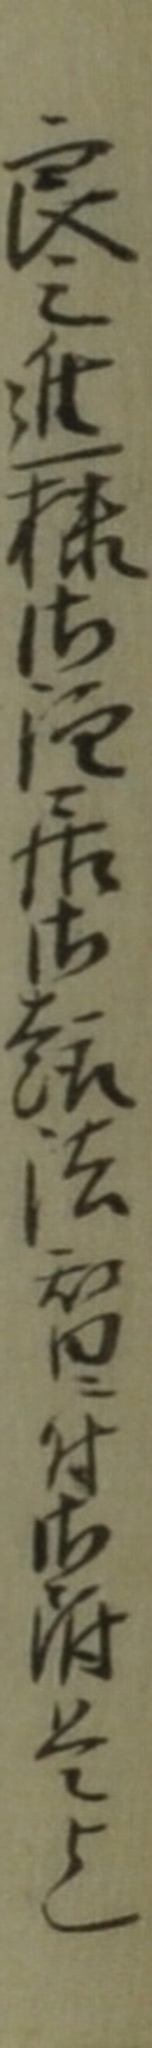良之進様御住居御趣法替ニ付御附是迄
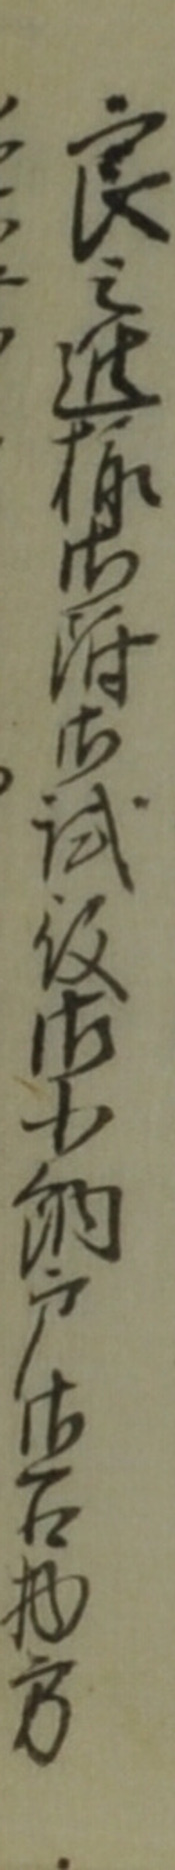良之進様御附御試役御小納戸御召物方
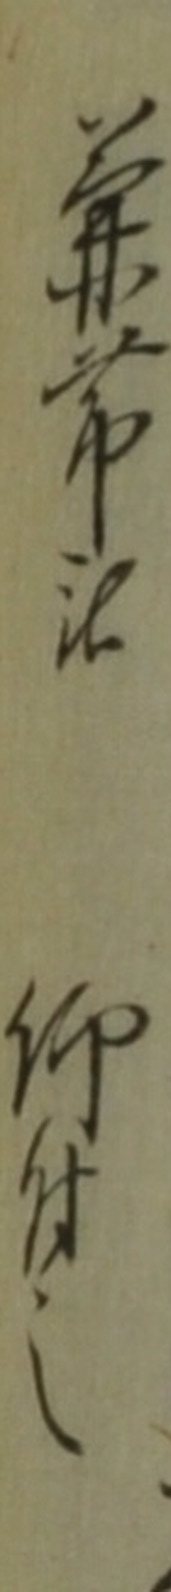兼帯被仰付之
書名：諸御役代々録（四）
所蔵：伊那市立高遠町図書館・合同会社AMANE
